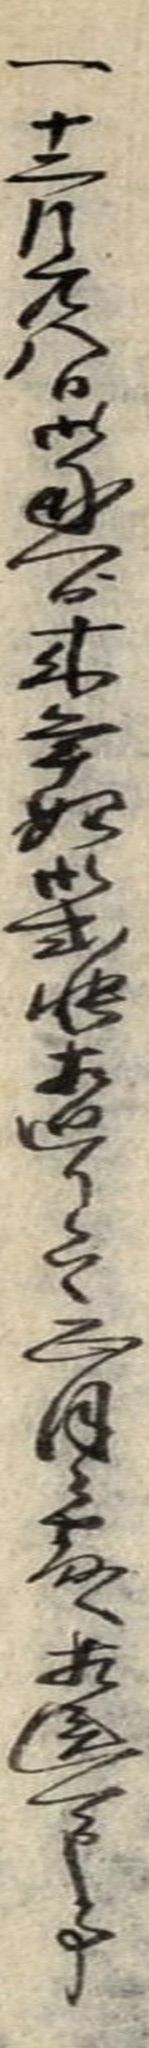一十二月廿八日御用人ゟ來年始御式帳相廻り候はゝ正月之番へ相達可申候事
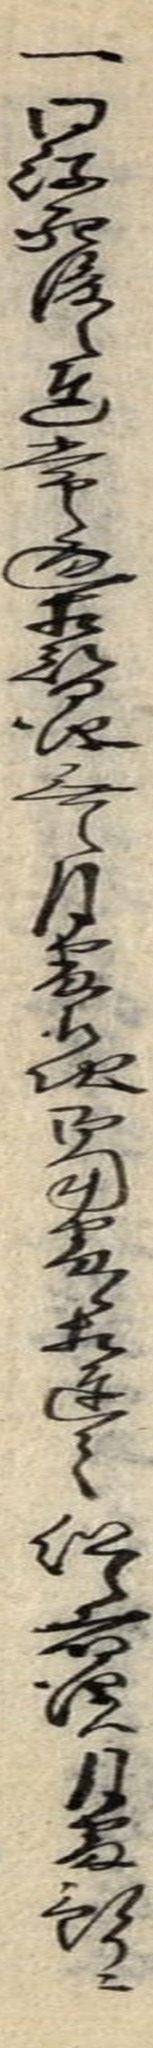一同役死後之達常之通相替候儀無之月番取次御用番へ相達之組之者儀は月番預りに
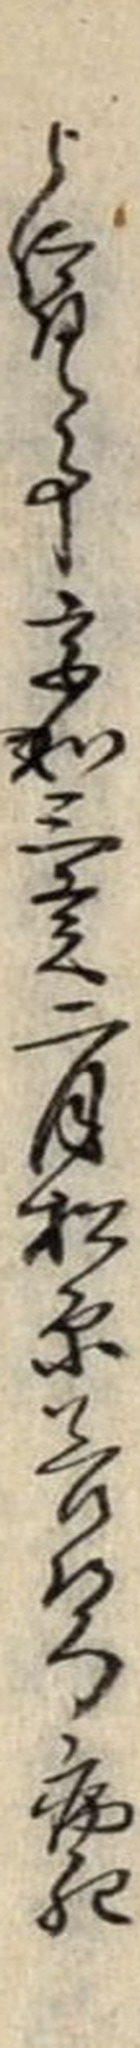被仰付候事享和三亥二月松原善右衛門病死
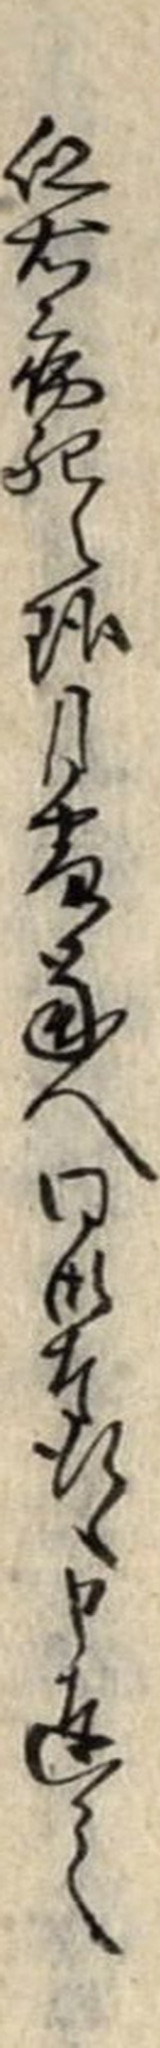但右病死之趣月番御用人同御奉行へ申達之

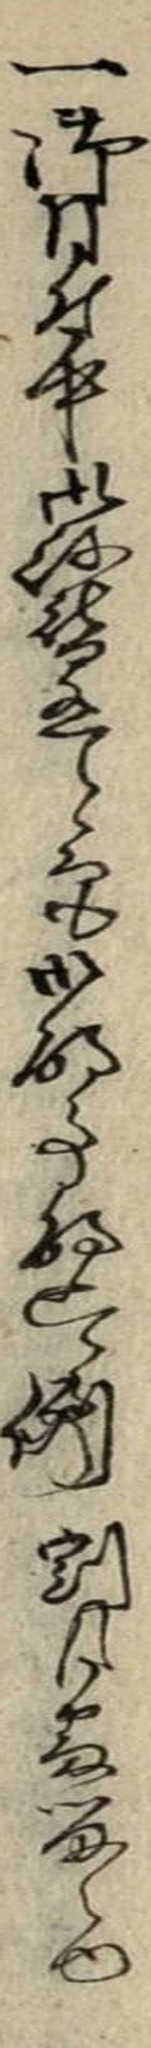一御目付中御役替有之候而も御触事触廻候例割月番留之内
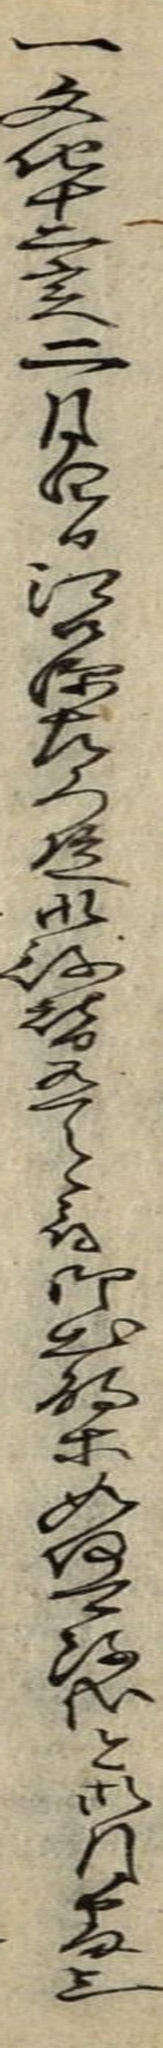一文化十二亥二月四日江口源左衛門殿御役替有之候に付御出触等如何可致哉と御月番三
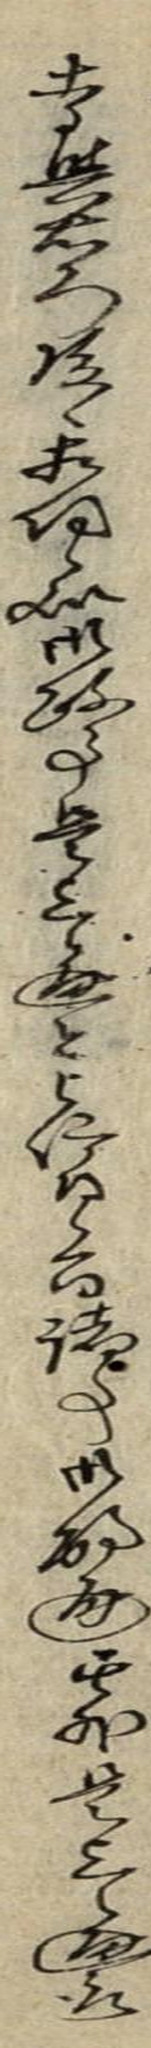寺与右衛門殿へ相伺候処御政事是迄之通と被仰付候間諸事御触通其外是迄之通取
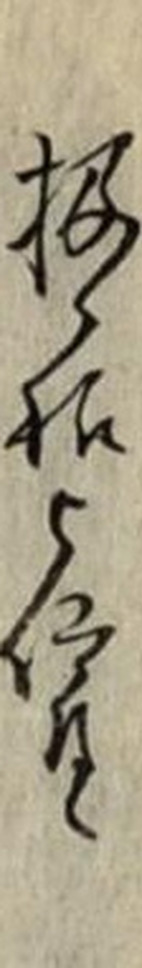扱候様被仰付候
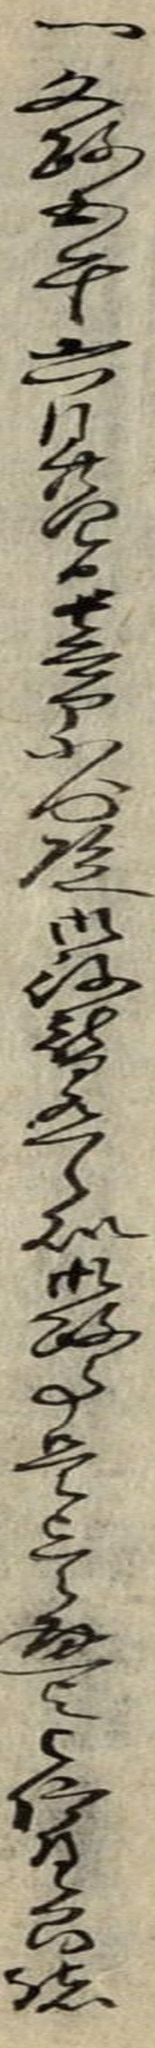一文政五午六月廿四日長谷部小右衛門殿御役替有之候処御政事是迄之通と被仰付候間諸
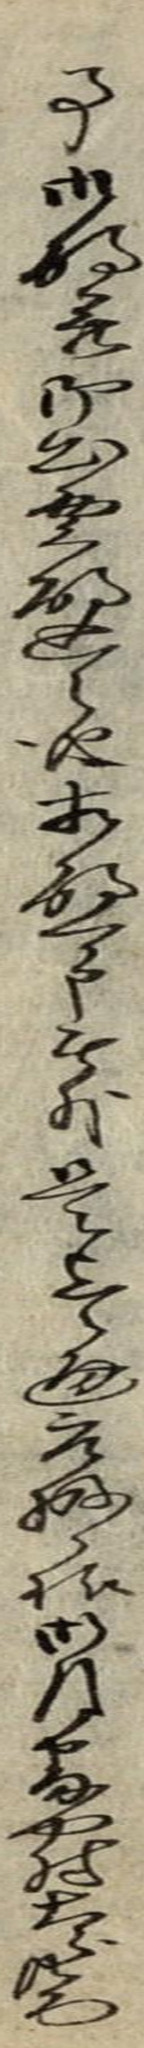事御触候共御出殿触廻り候儀相触可申其外是迄之通取扱候様御月番中村太郎左衛門
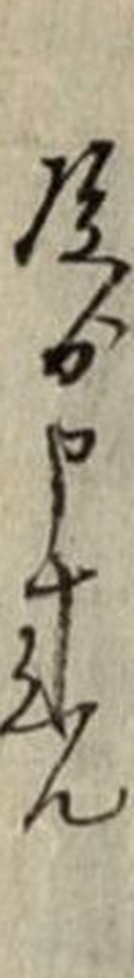殿ゟ申来る
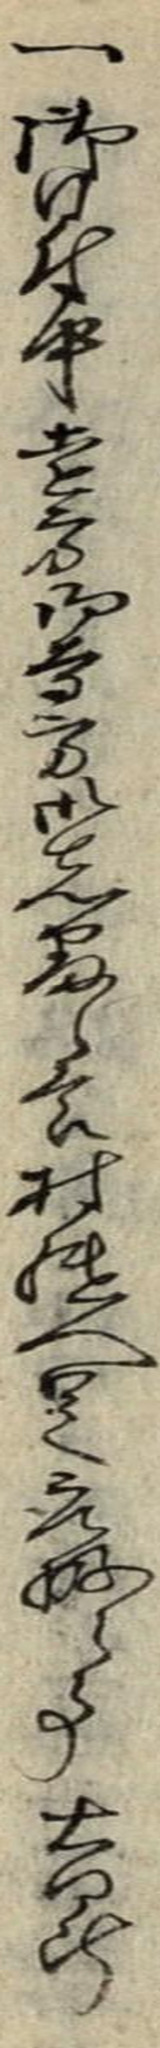一御目付中遠方御寺方御先番之節村継人足取扱之事右同断
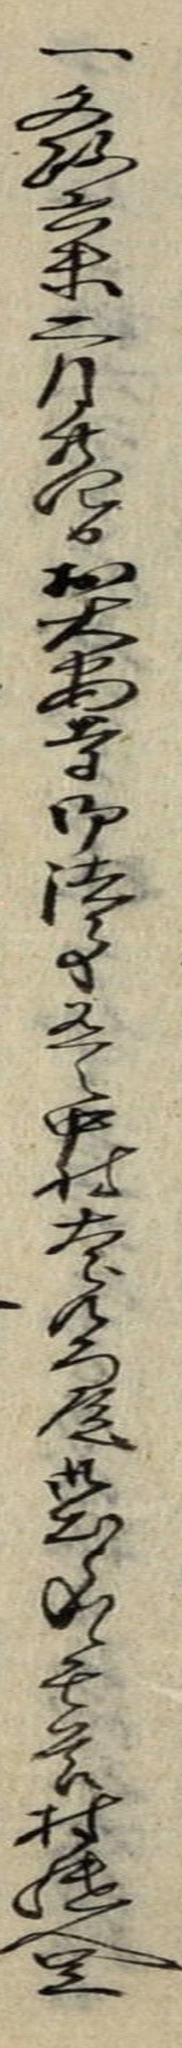一文政六未二月廿四日於大安寺御法事有之中村太郎左衛門殿御出被成候節村継人足
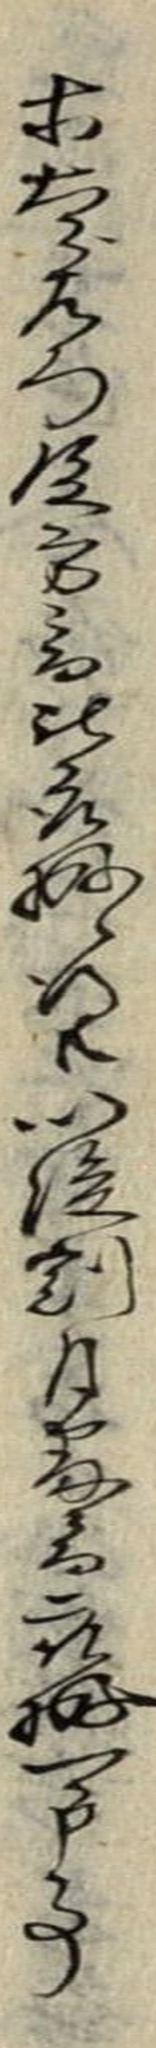等太郎左衛門殿方に而被取扱候得共以後割月番に而取扱可申事
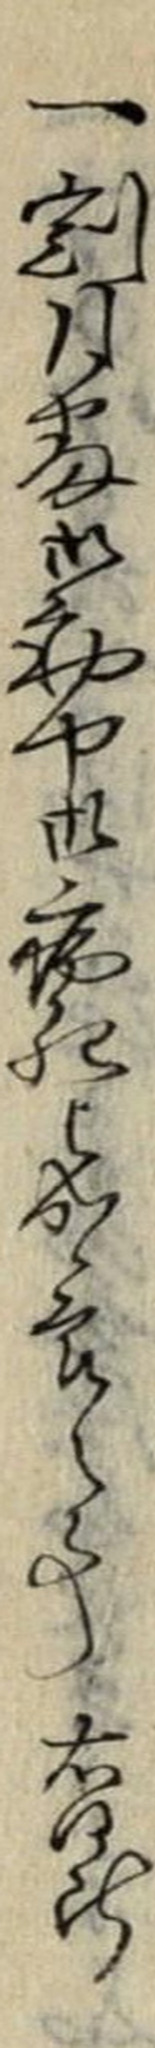一割月番御勤中御病死被成候節之事右同断
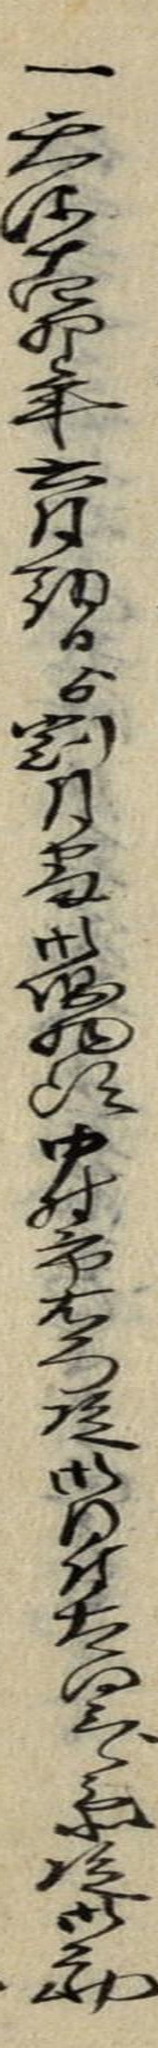一天保十四卯年六月朔日ゟ割月番御側物頭中村市右衛門殿御目付太田三郎兵衛殿御勤
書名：蒐輯之部
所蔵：福井県文書館 Fukui Prefectural Archives
